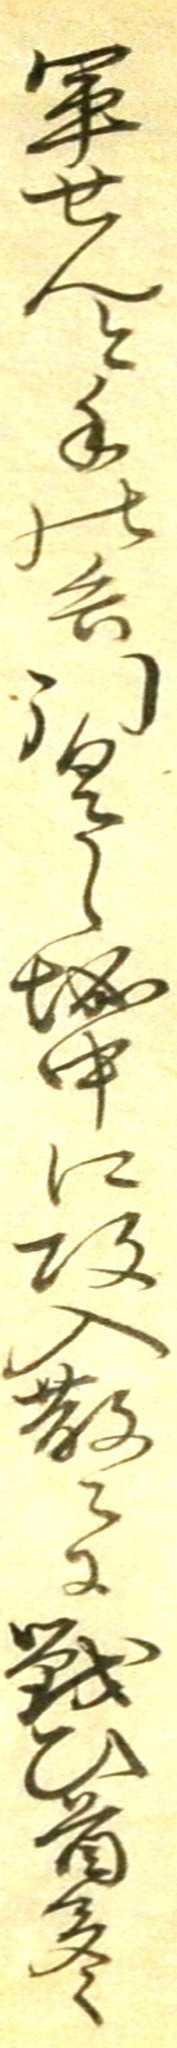軍せんと手の兵引具し城中に攻入散々に戦ひ首多く
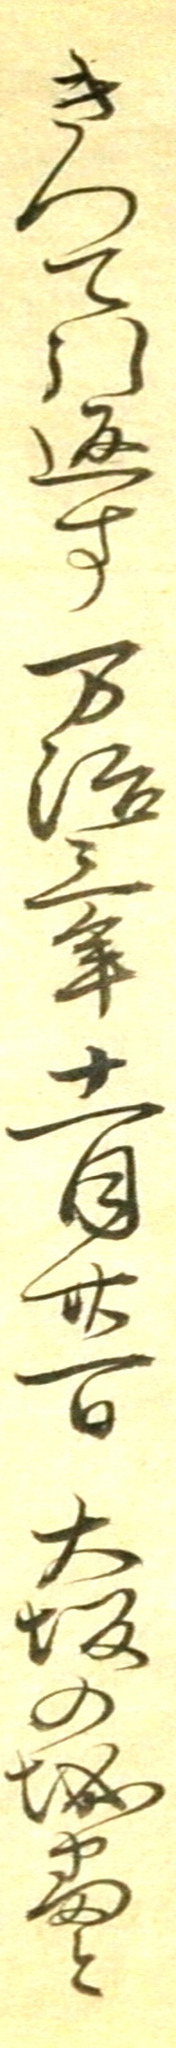きつて引返す万治三年十一月廿一日大坂の城番と
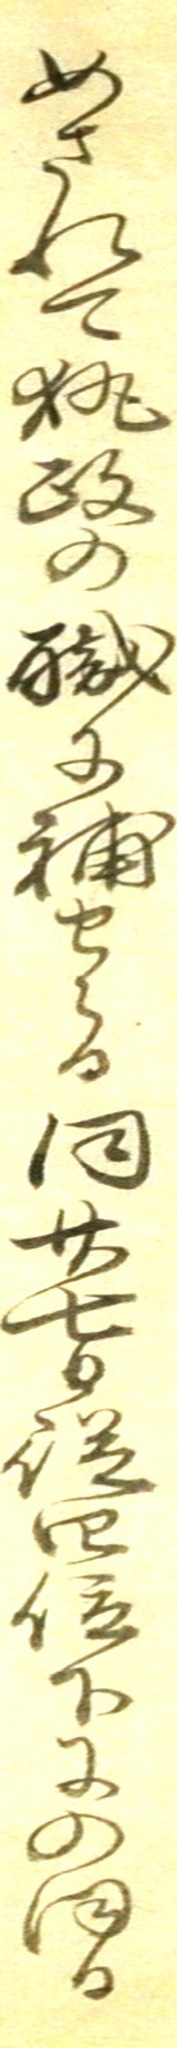めされて執政の職に補せらる同廿七日従四位下にのほる
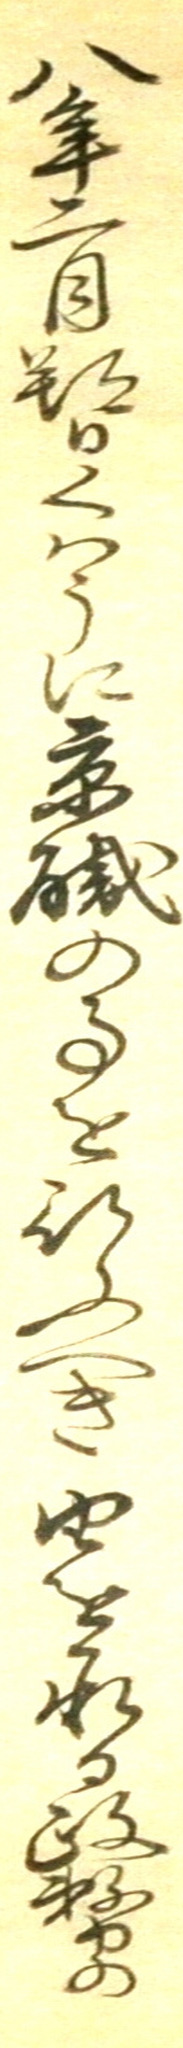八年二月朔日くはうに京職の事を行ふへき由を承る政務の
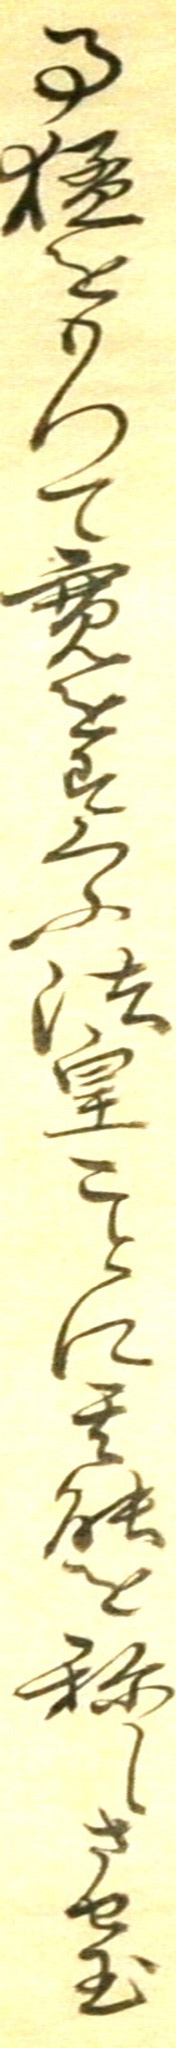事猛をもつて寛をすくふ法皇ことに其能を称しさせ玉
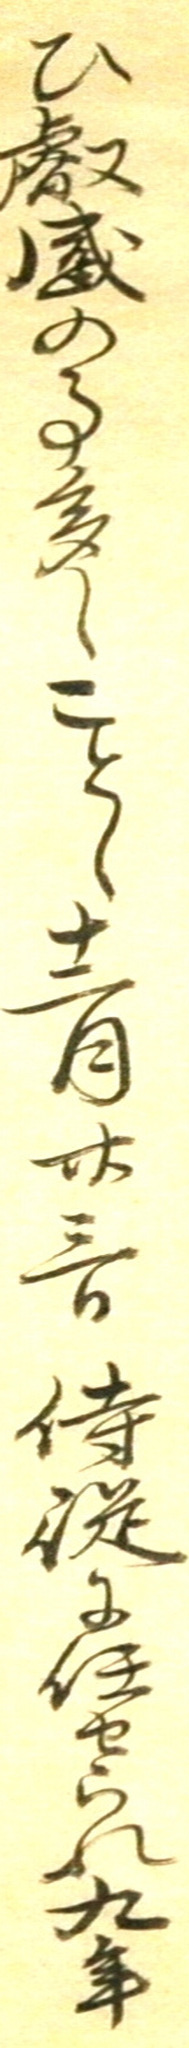ひ叡感の事多しことし十二月廿三日侍従に任せられ九年
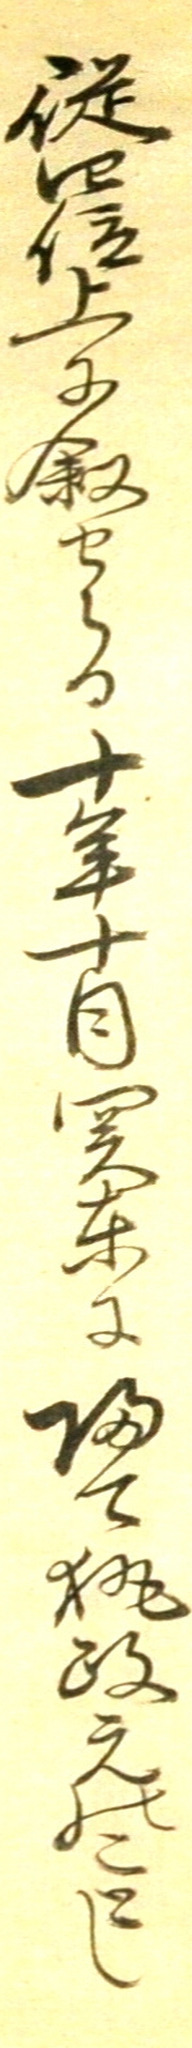従四位上に叙せらる十年十月関東に帰て執政元のことし
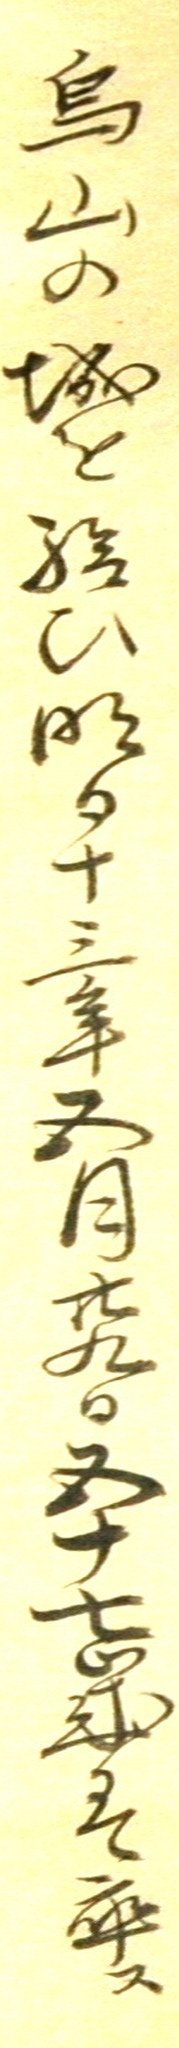烏山の城を給ひ明る十三年五月廿九日五十七歳にて卒ス

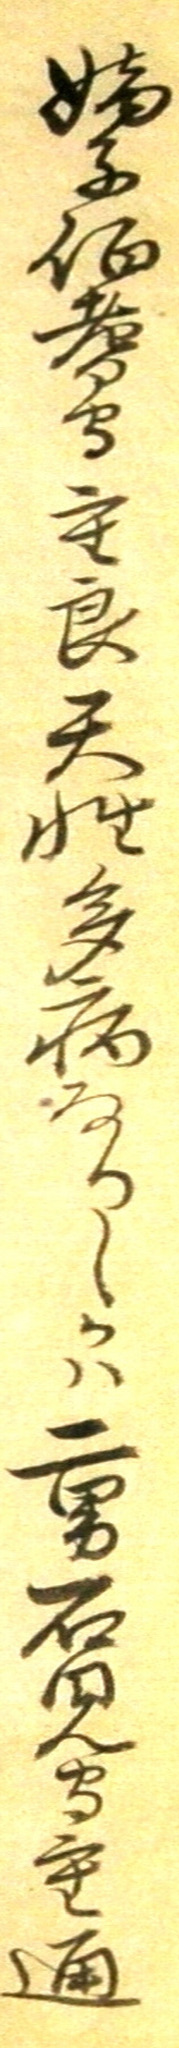嫡子伯耆守重良天性多病なりしかは二男石見守重通
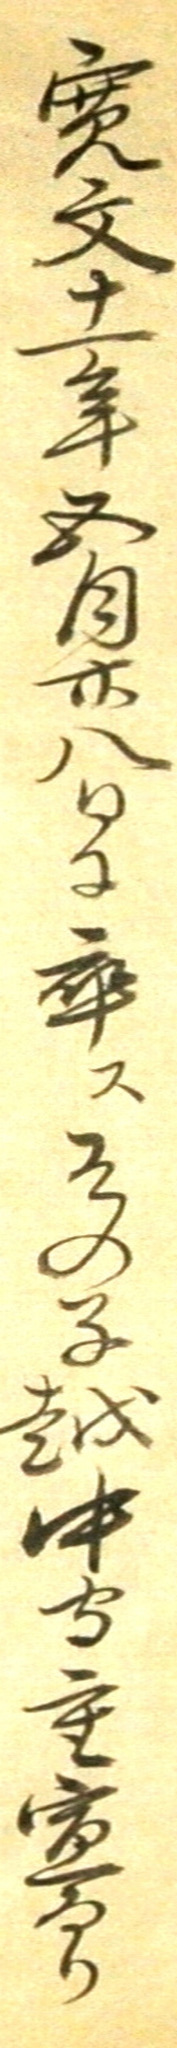寛文十一年五月廿八日に卒スその子越中守重宣なり
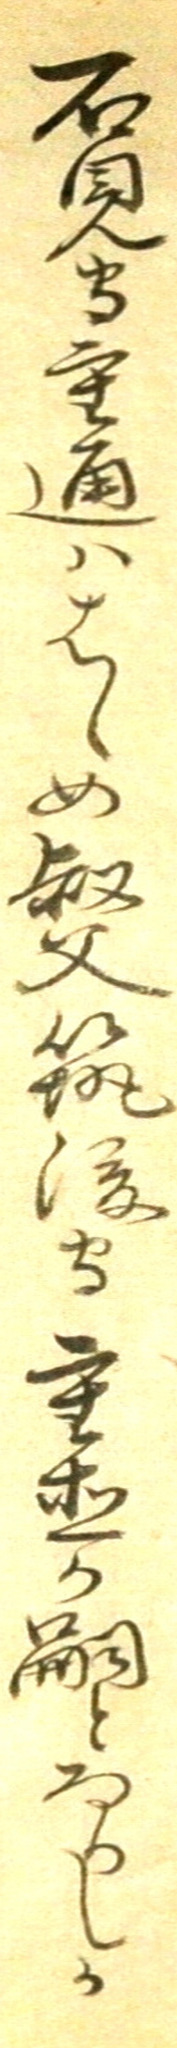石見守重通ははしめ叔父筑後守重直か嗣となりしか
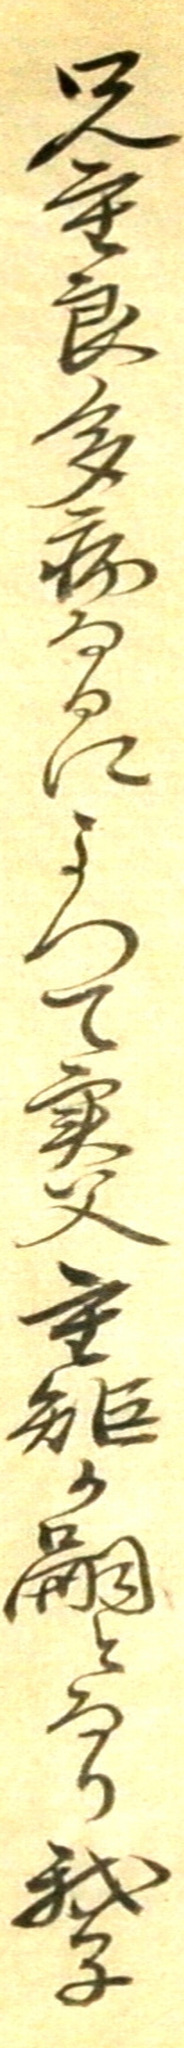兄重良多病なるによつて実父重矩か嗣となり我子
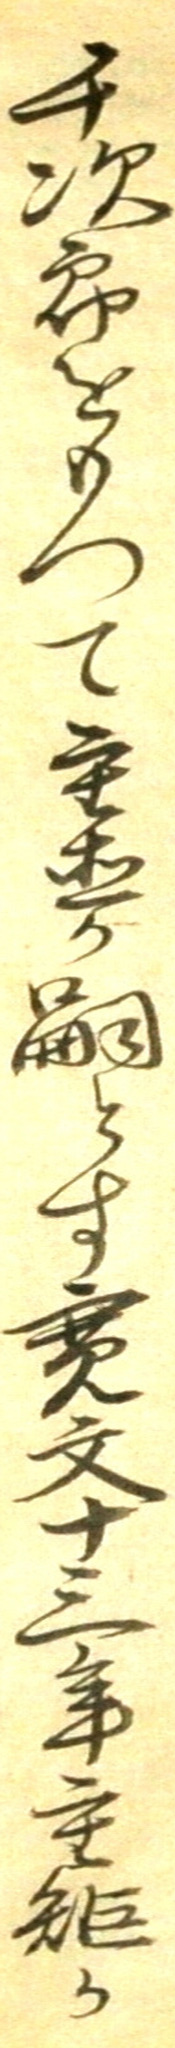千次郎をもつて重直か嗣とす寛文十三年重矩か
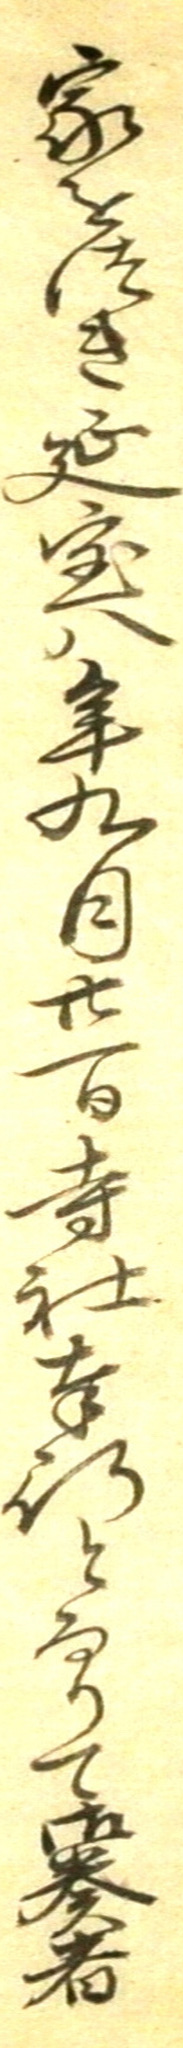家をつき延宝八年九月廿一日寺社奉行となりて御奏者
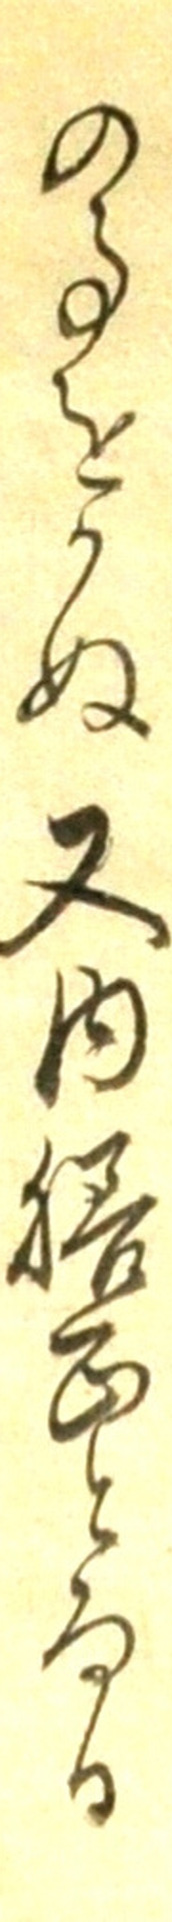も事をかぬ又内膳正となる
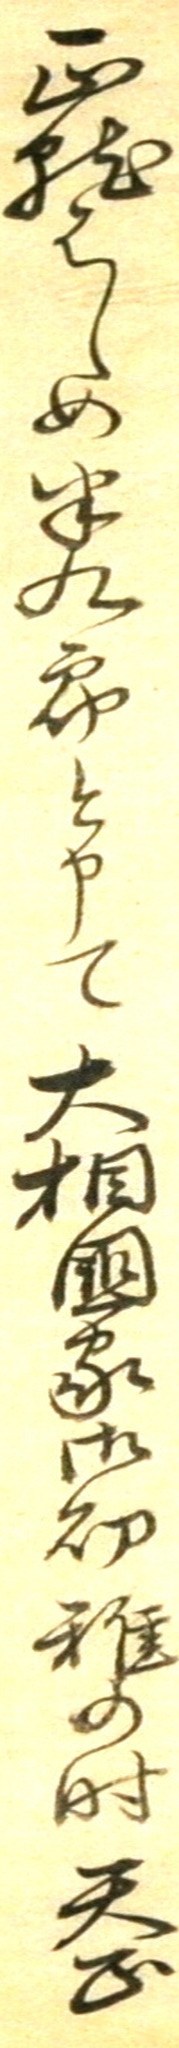正就はしめ半九郎と申て大相国家御幼稚の時天正
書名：藩翰譜（五）
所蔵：伊那市立高遠町図書館・合同会社AMANE
